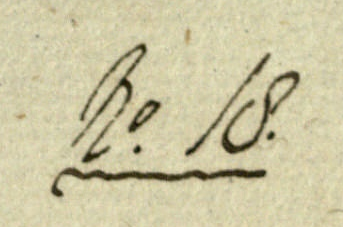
No 18.
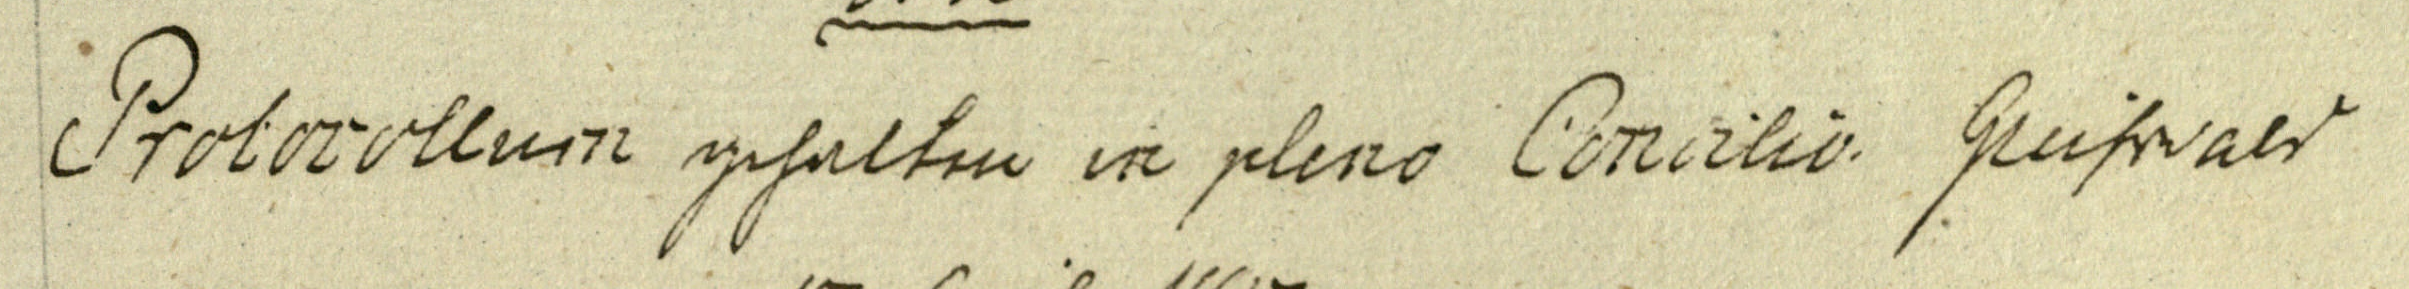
Protocollum gehalten in pleno Concilio Greifswald
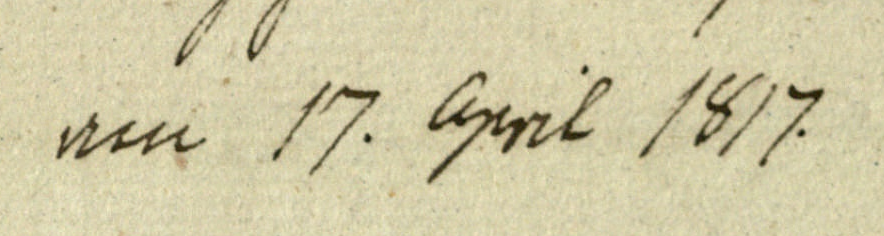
am 17. April 1817.
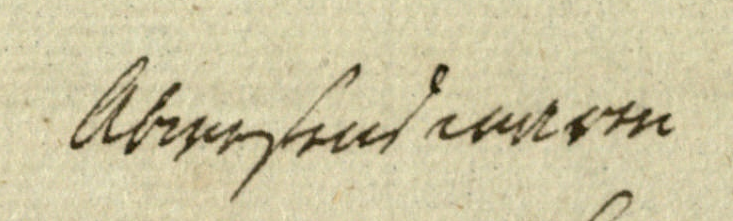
Abwesend waren
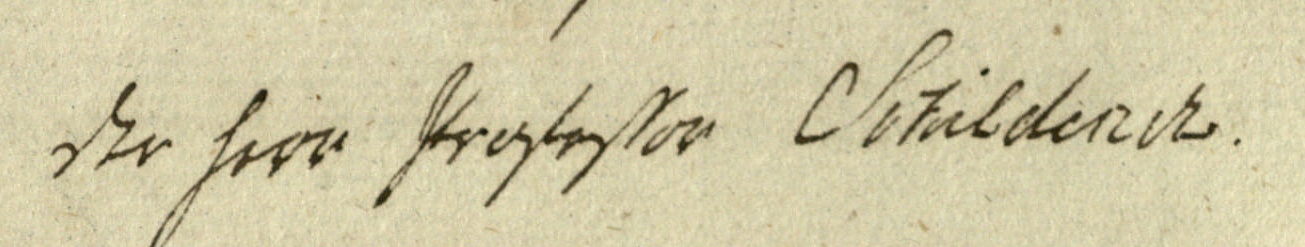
der Herr Professor Schildener.
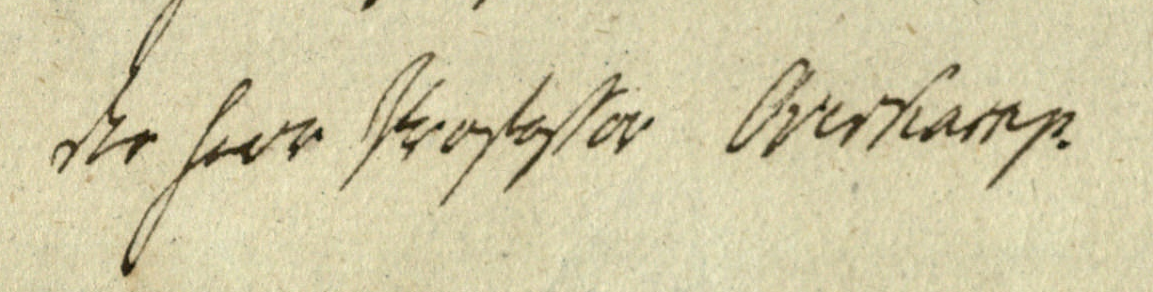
der Herr Professor Overkamp.
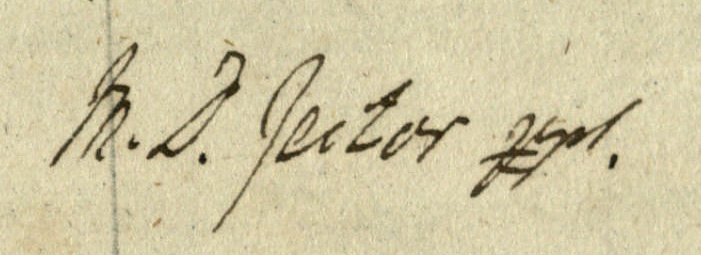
M. D. Rector ppt.
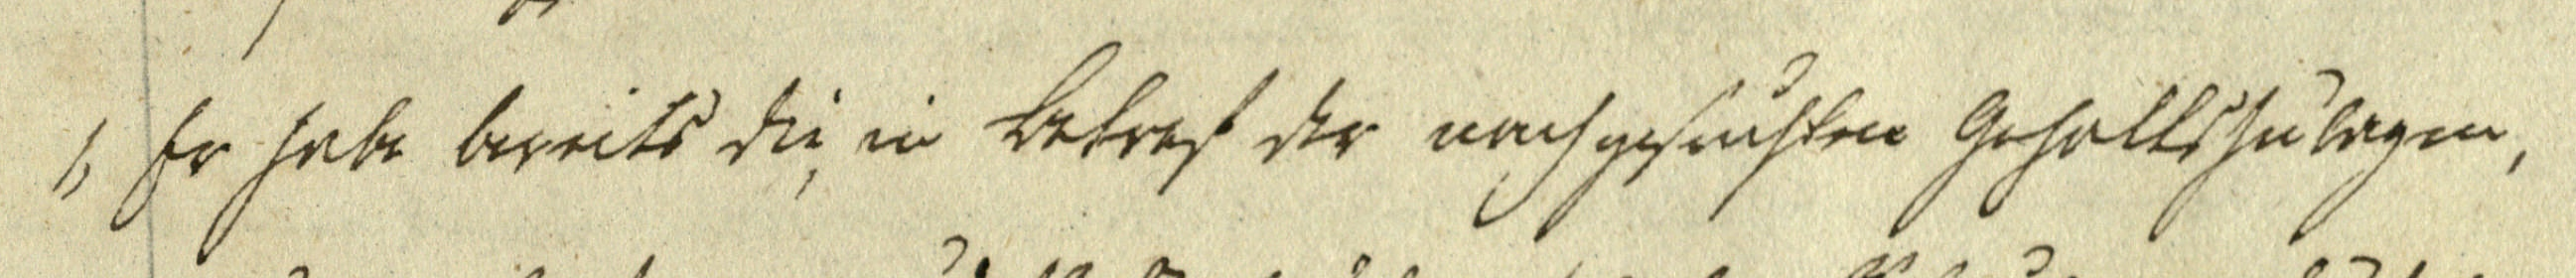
1 Er habe bereits die in Betref der nachgesuchten Gehaltszulagen,
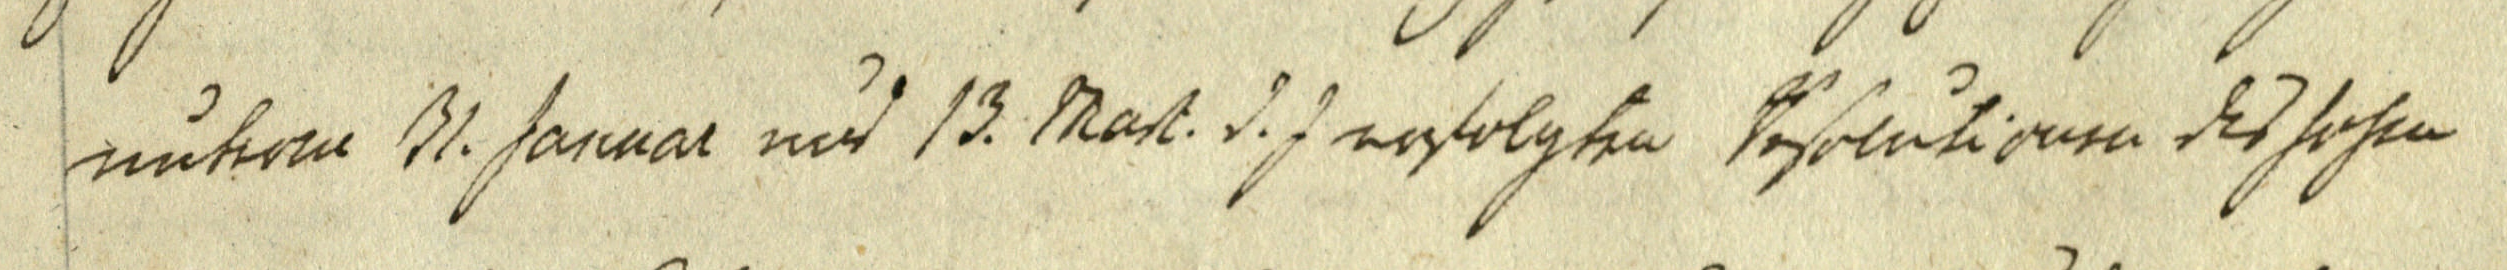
unterm 31. Januar und 13. Mart. d. J. erfolgten Resolutionen des hohen
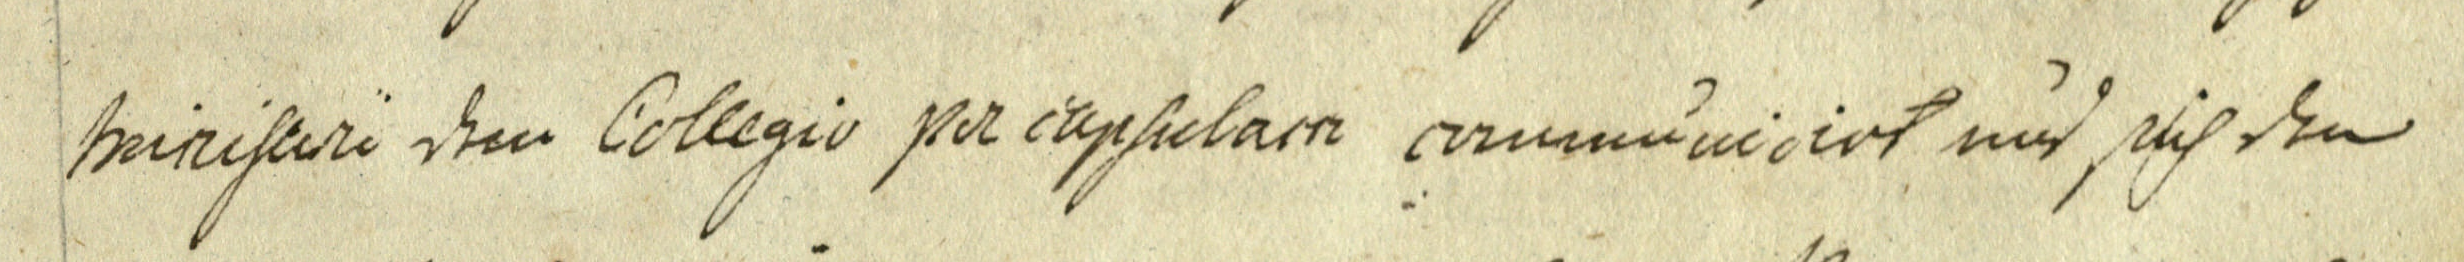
Ministerii dem Collegio per capsulam communicirt und sich den
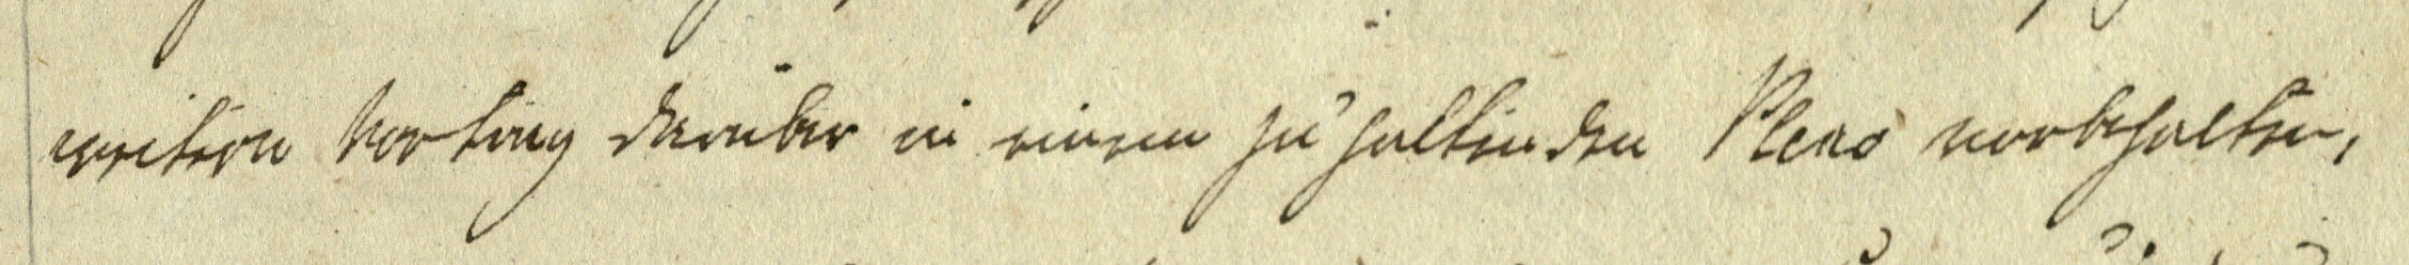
weitern Vortrag darüber in einem zu haltenden Pleno vorbehalten,
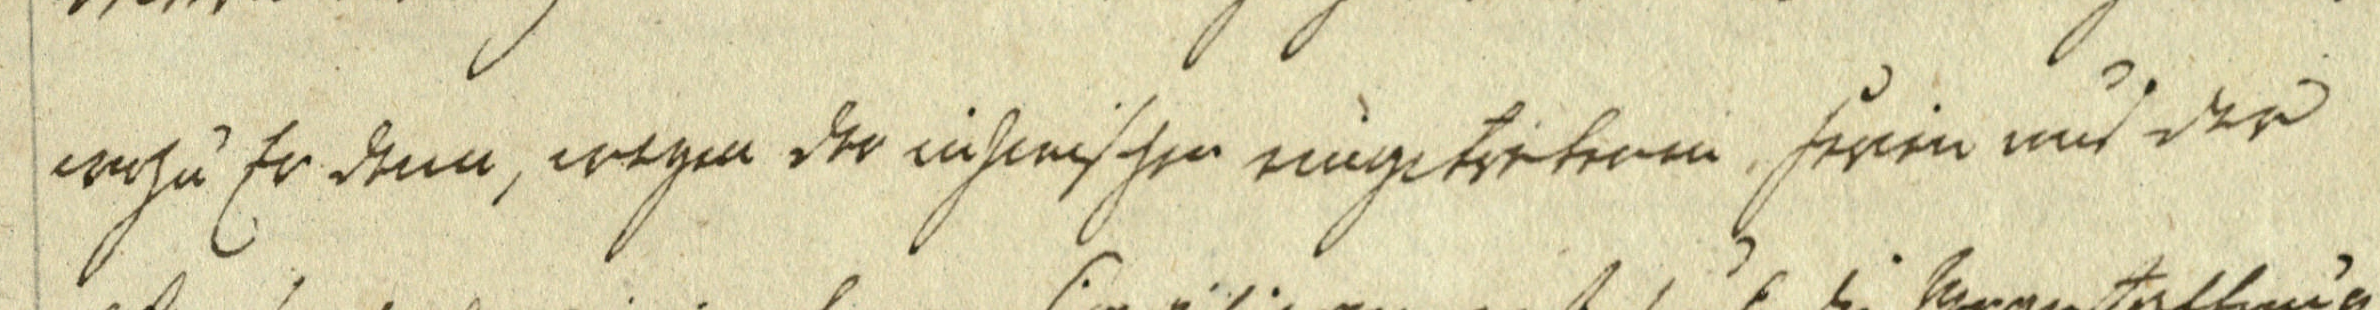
wozu Er denn, wegen der inzwischen eingetretenen Ferien und der
